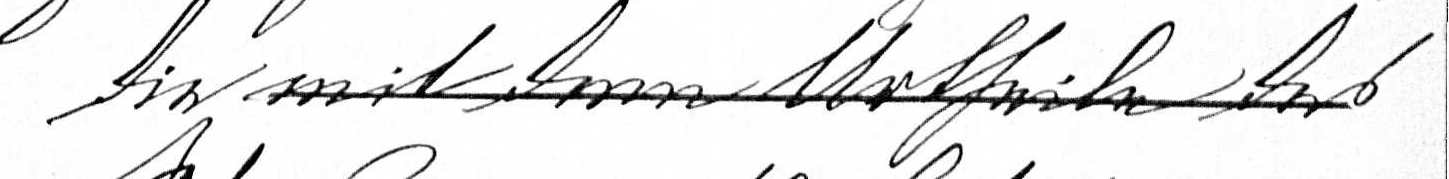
die mit dem Urtheile des
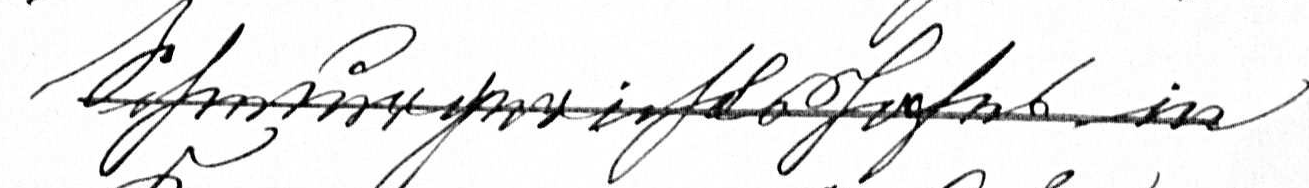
Schwurgerichtshofes in
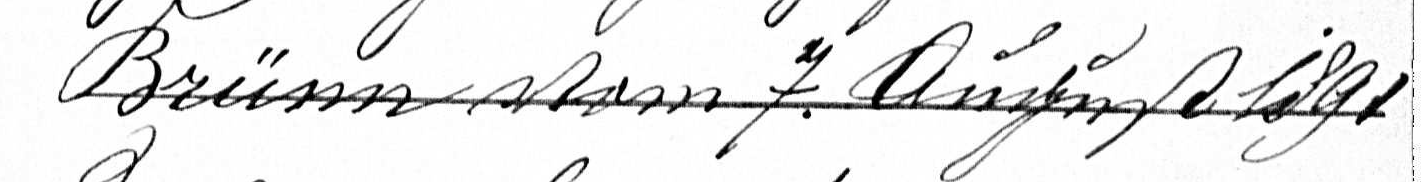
Brünn vom 7. August 1891
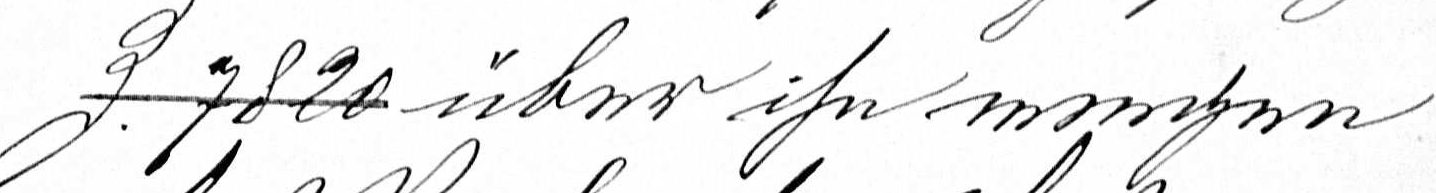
Z. 7820 über ihn wegen
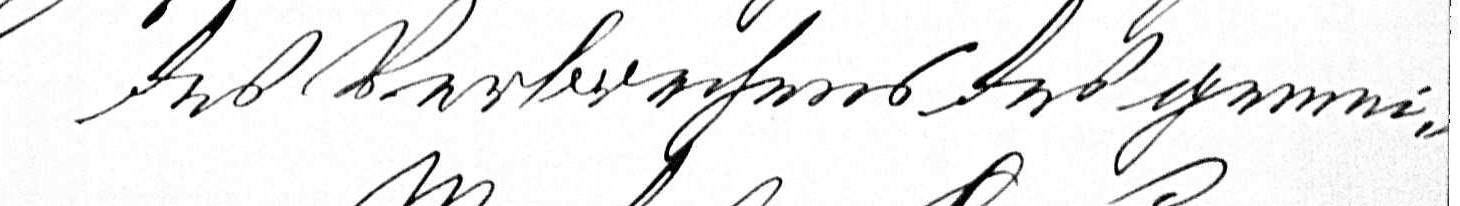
des Verbrechens des gemei¬
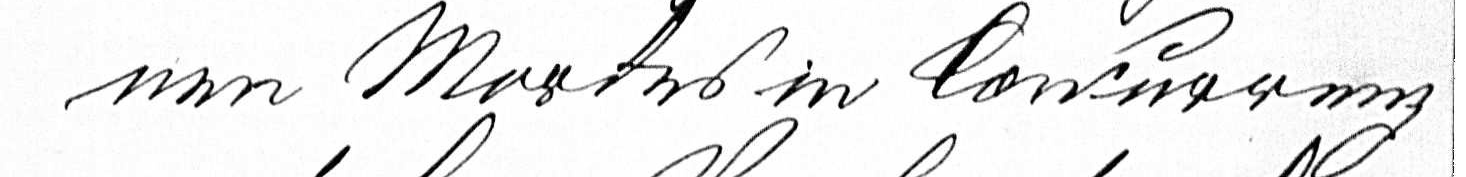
nen Mordes in Concurrenz
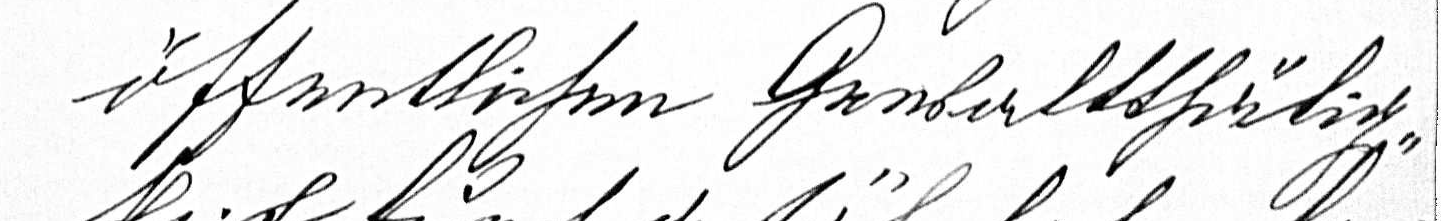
öffentlichen Gewaltthätig¬
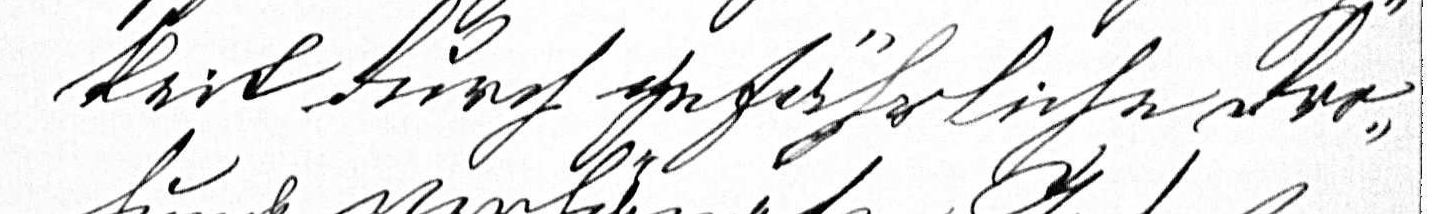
keit durch gefährliche Dro¬
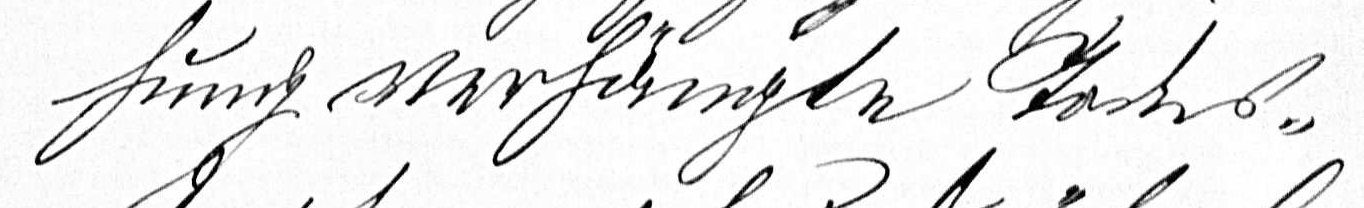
hung verhängte Todes¬
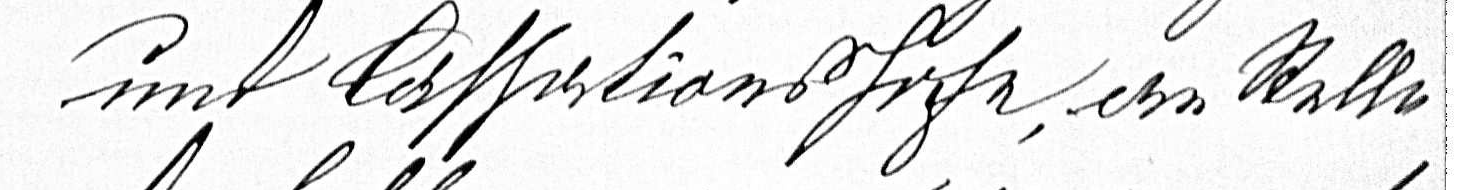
und Cassationshofe an Stelle
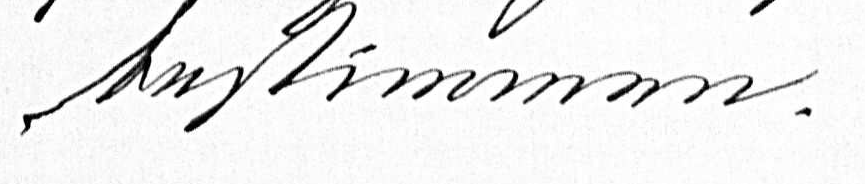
bestimmen.
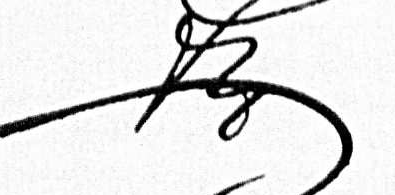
FJ
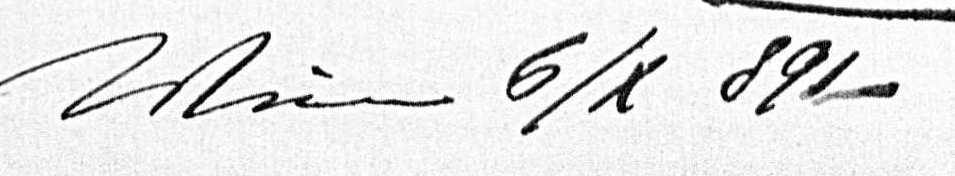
Wien, 6/X 1891
